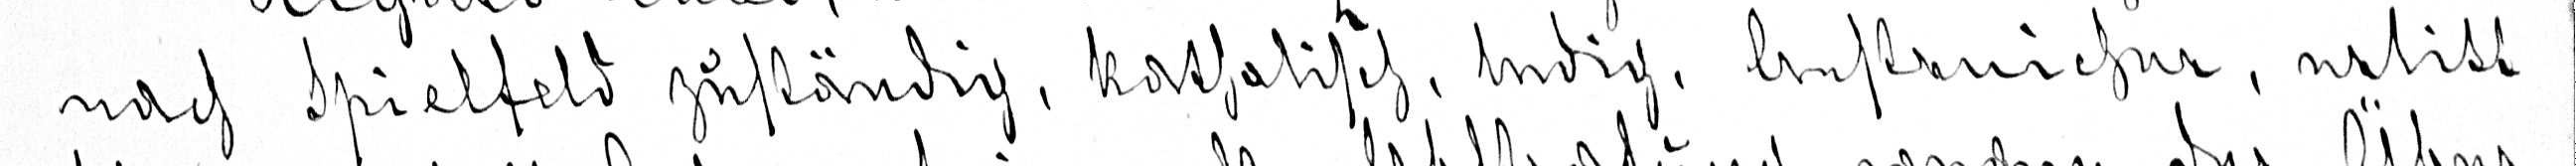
nach Spielfeld zuständig, katholisch, ledig, Anstreicher, erlitt
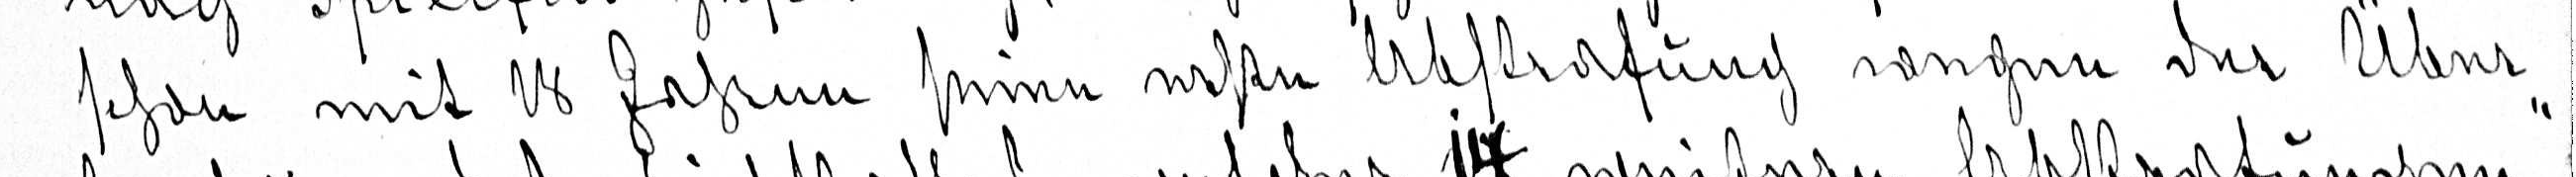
schon mit 18 Jahren seine erste Abstrafung wegen der Über¬
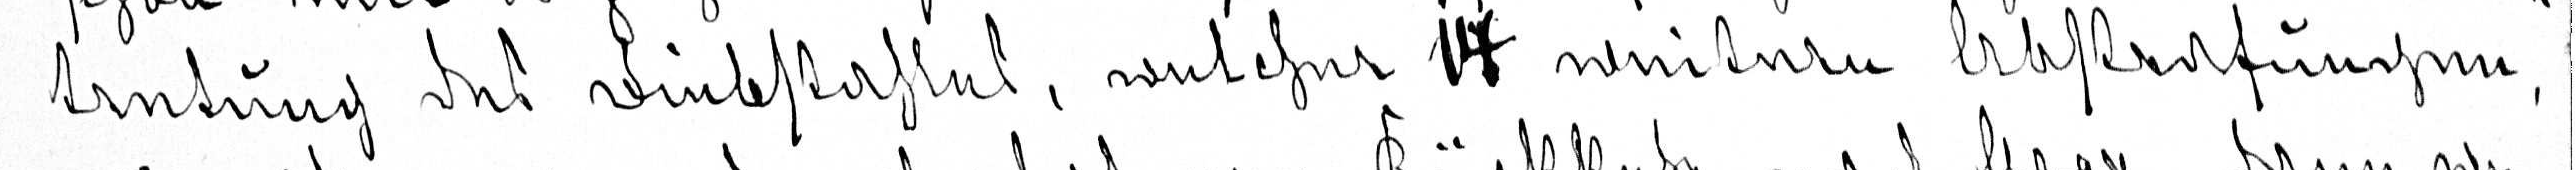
tretung des Diebstahles, welcher 14 weitere Abstrafungen
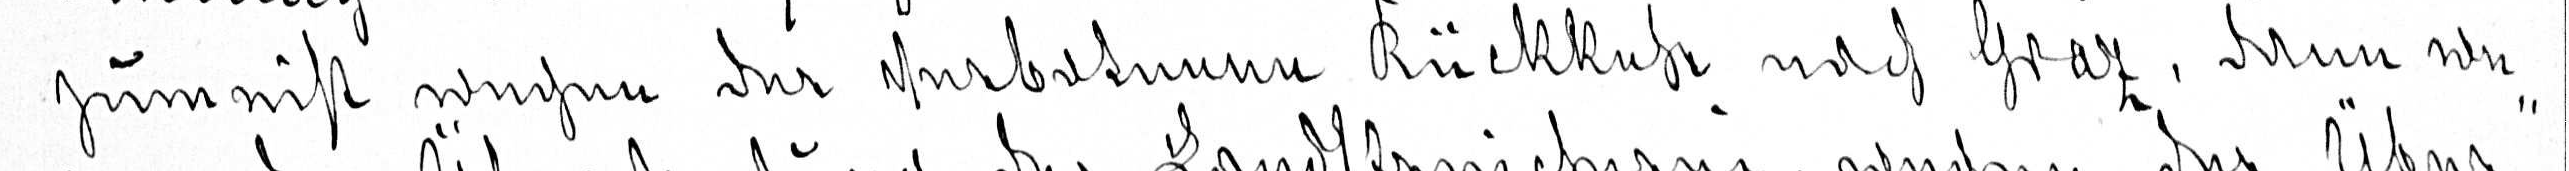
zumeist wegen der Verbotenen Rückkehr nach Graz, dann we¬
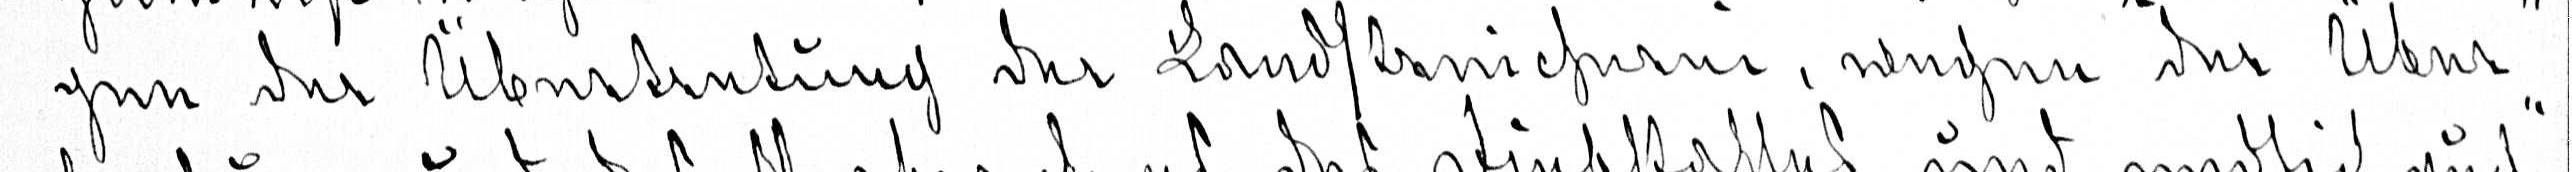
gen der Übertretung der Landstreicherei, wegen der Über¬
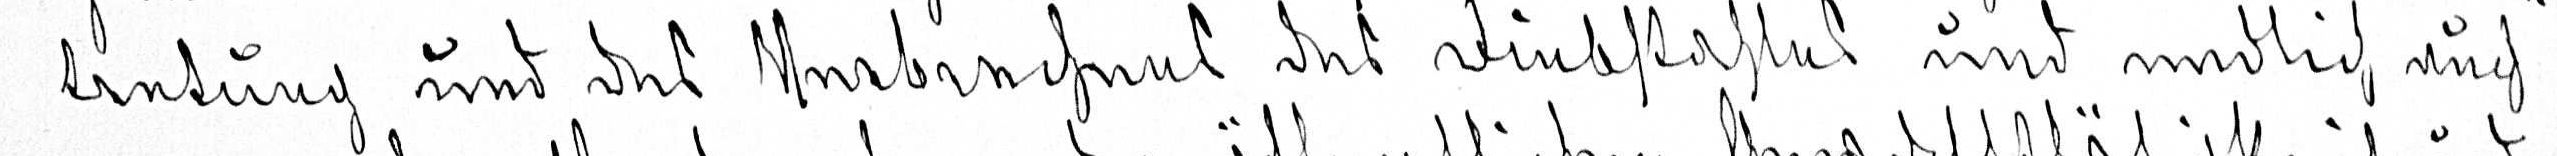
tretung und der Verbrechen des Diebstraftes und molich auch
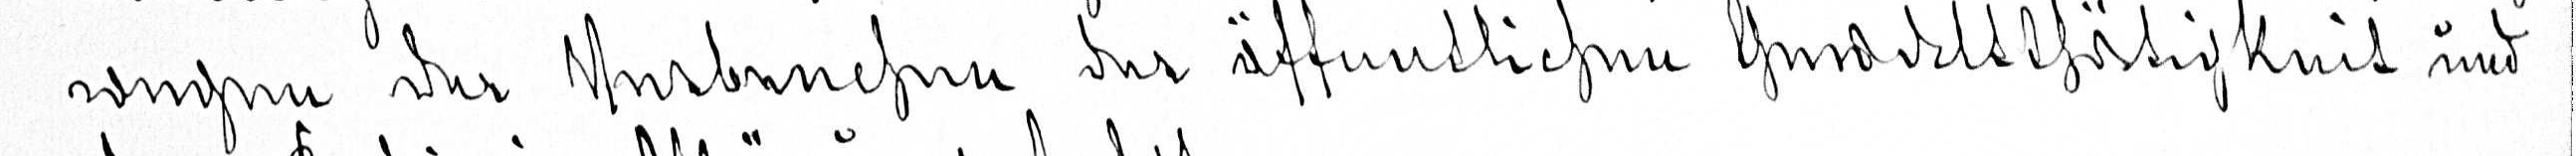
wegen der Verbrechen der öffentlichen Gewaltthätigkeit und
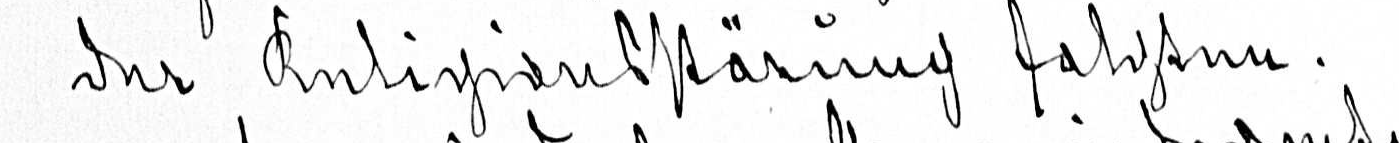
der Religionsstörung folgten.
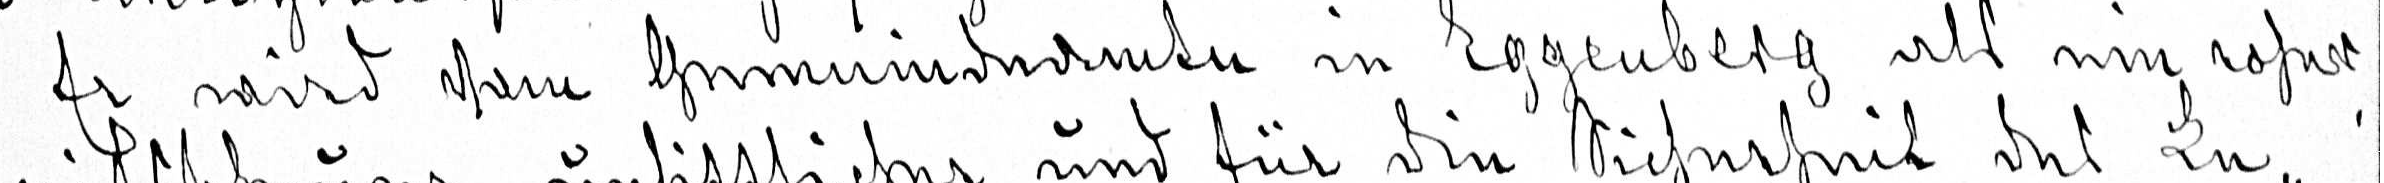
Er wird vom Gemeindeamte in Eggenberg als ein roher
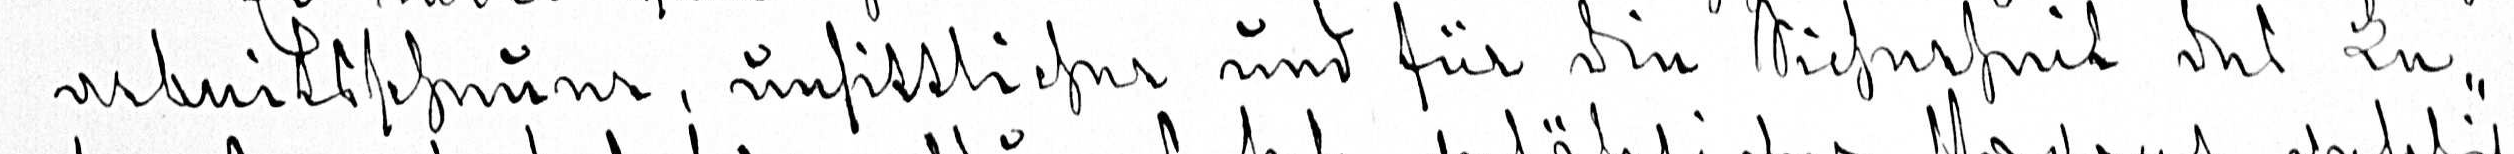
arbeitsscheuer, unsittlicher und für die Sicherheit des Le¬
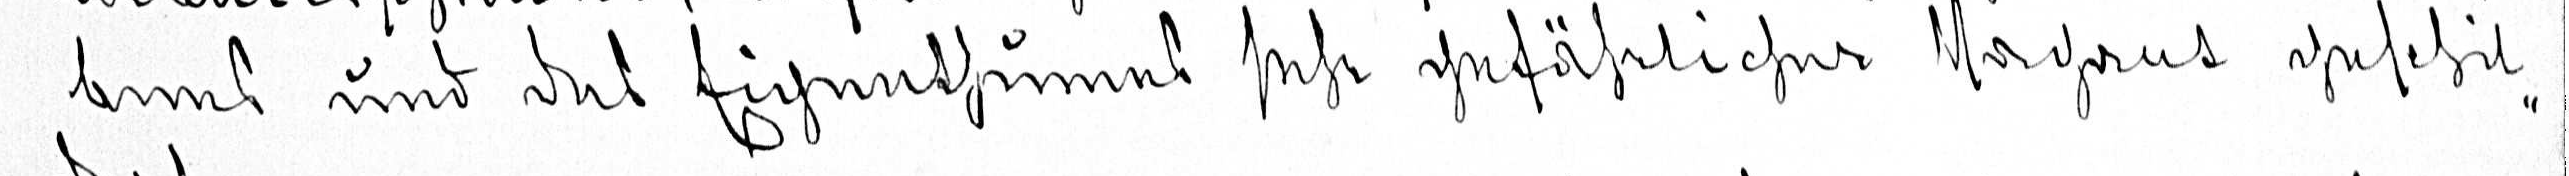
bens und des Eigenthumes sehr gefährlicher Vagant geschil¬
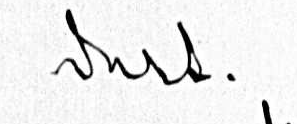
dert.
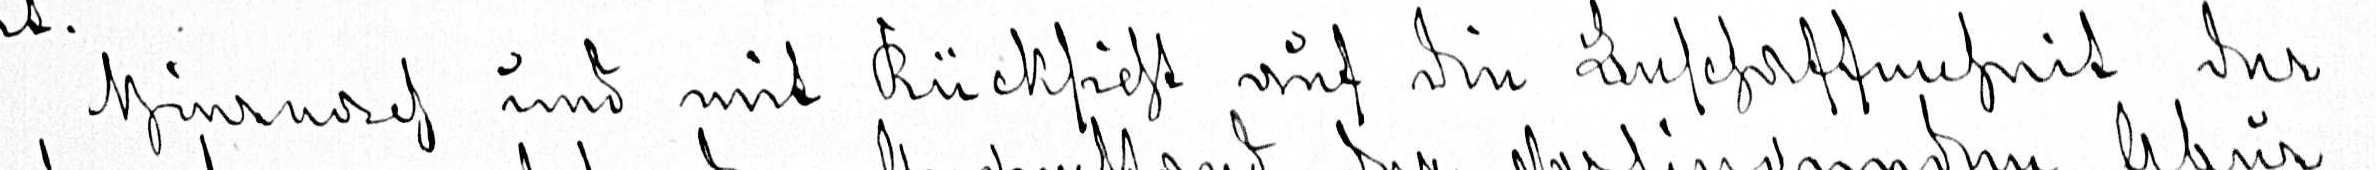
Hiernach und mit Rücksicht auf die Beschaffenheit der
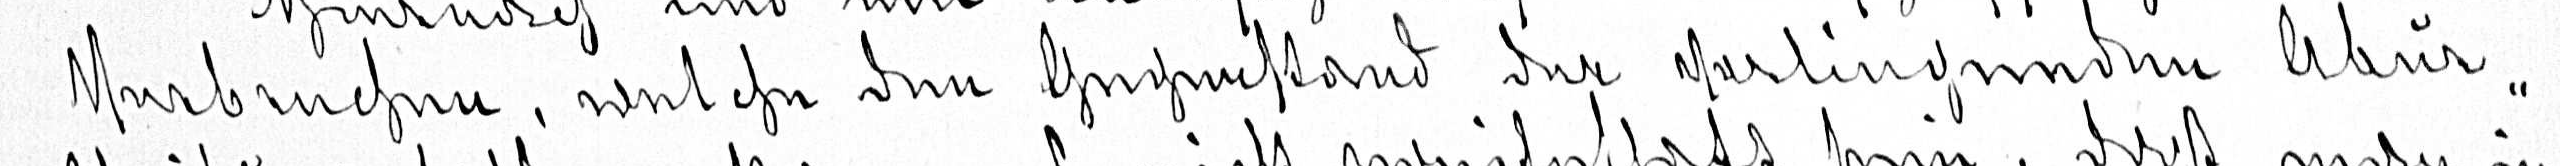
Verbrechen, welche den Gegenstand der vorliegenden Abur¬
